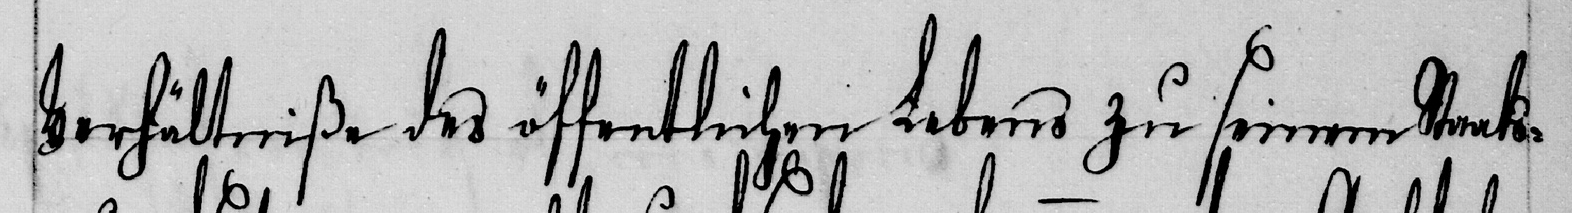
Verhältniße des öffentlichen Lebens zu seinem Staat¬
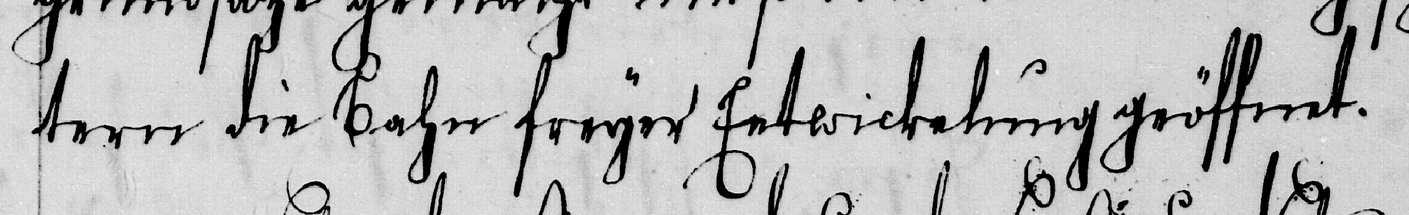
htern die Bahn freyer Entwickelung geöffnet.
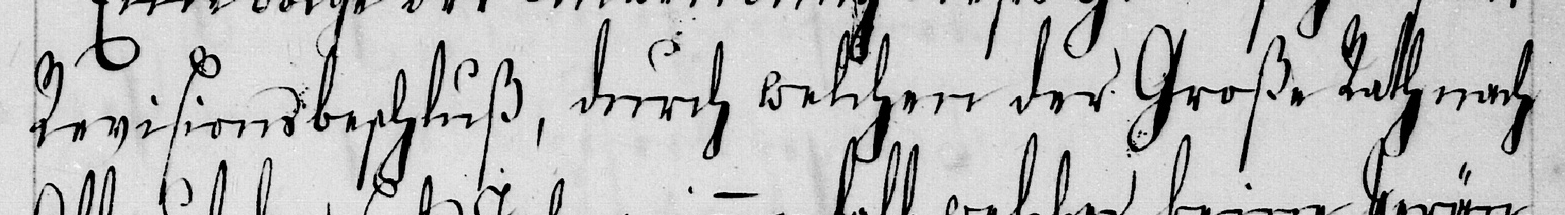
Revisionsbeschluß, durch welchen der Große Rath nach
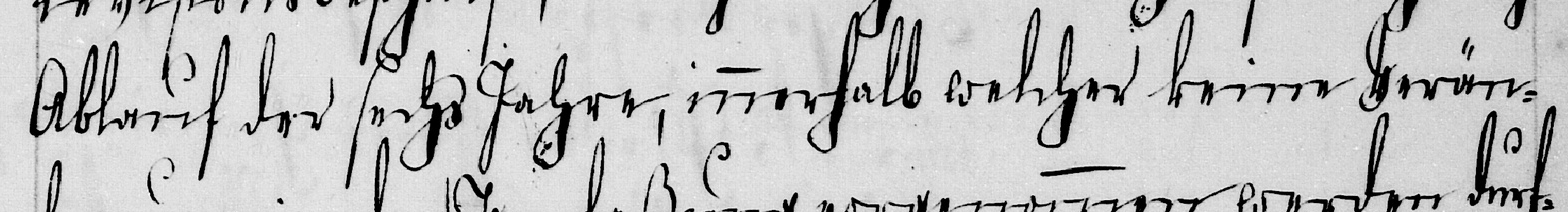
Ablauf der sechs Jahre, innerhalb welcher keine Verän¬
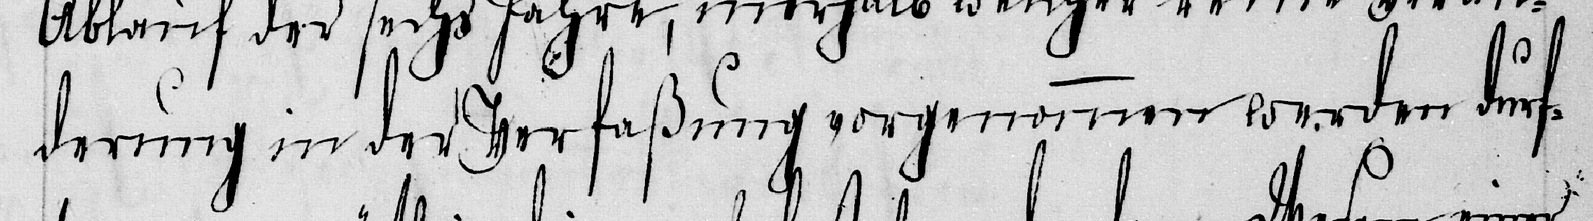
derung in der Verfaßung vorgenommen werden durf¬
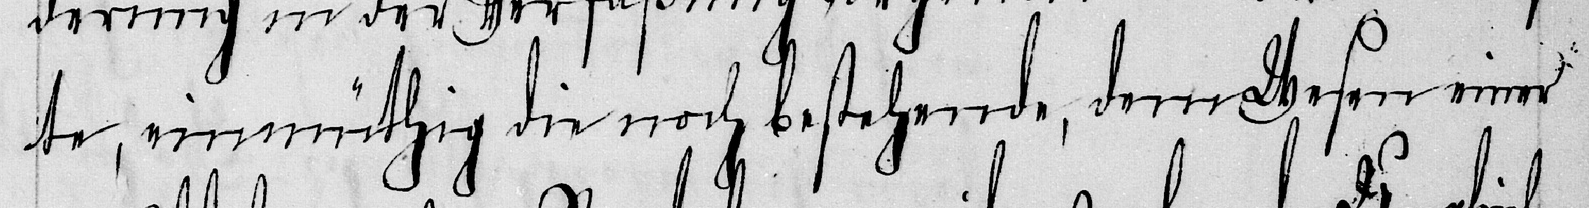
te, einmüthig die noch bestehende, dem Wesen einer
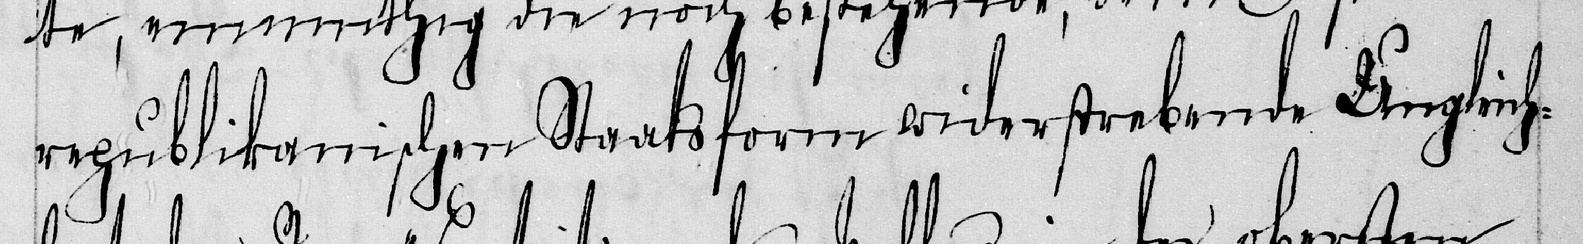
republikanischen Staatsform widersprechende Ungleich¬
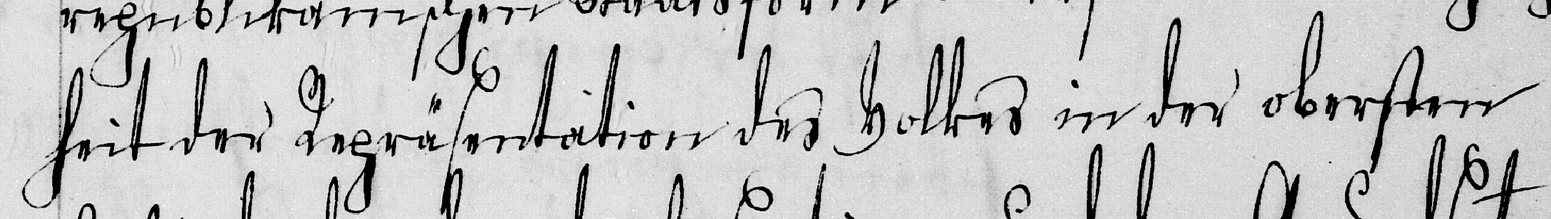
heit der Repräsentation des Volkes in der obersten
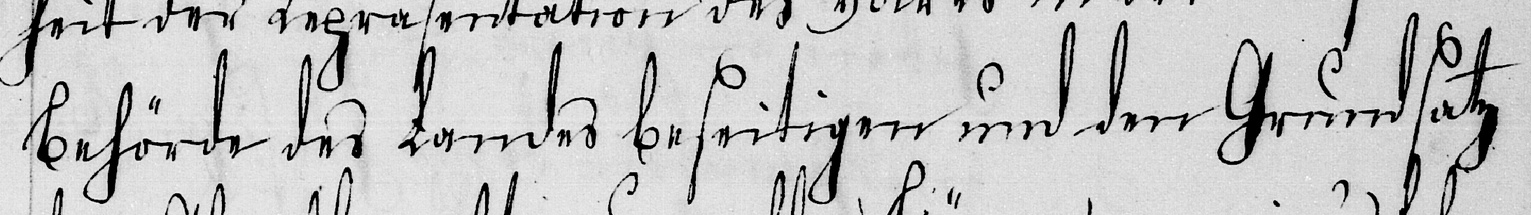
Behörde des Landes beseitigen und den Grundsatz
